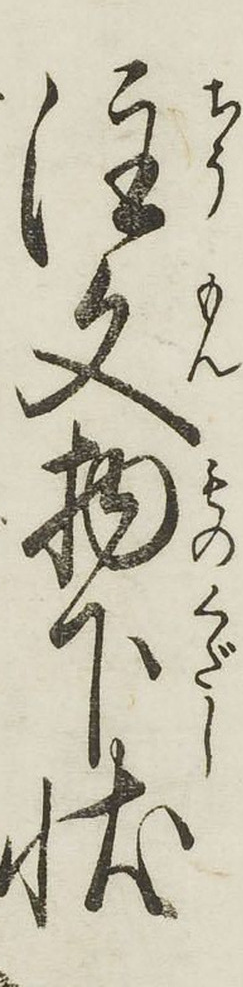注文物下状
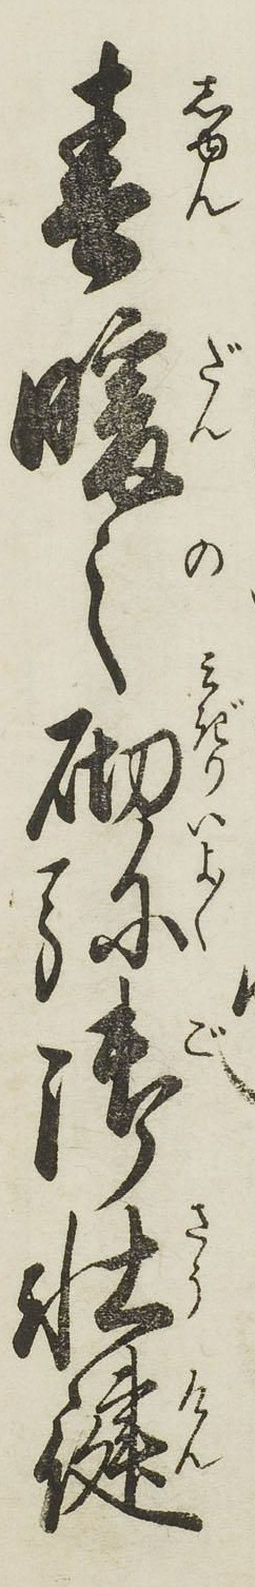春暖之砌弥御壮健
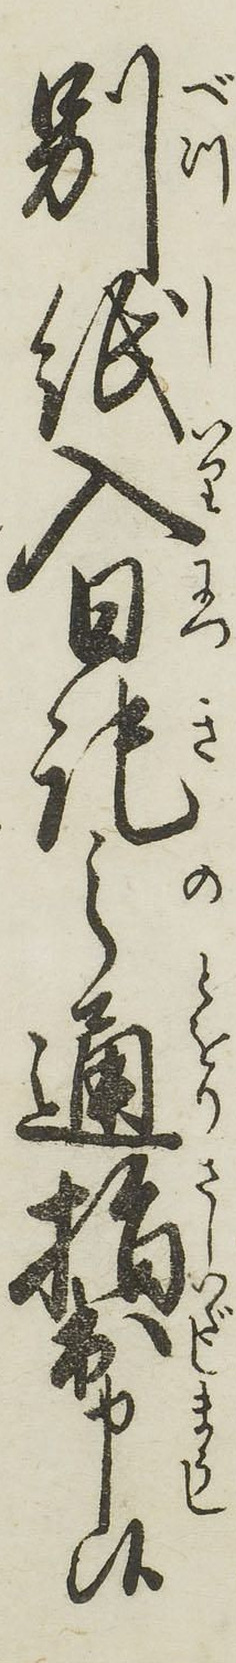別紙入日記之通指出申候

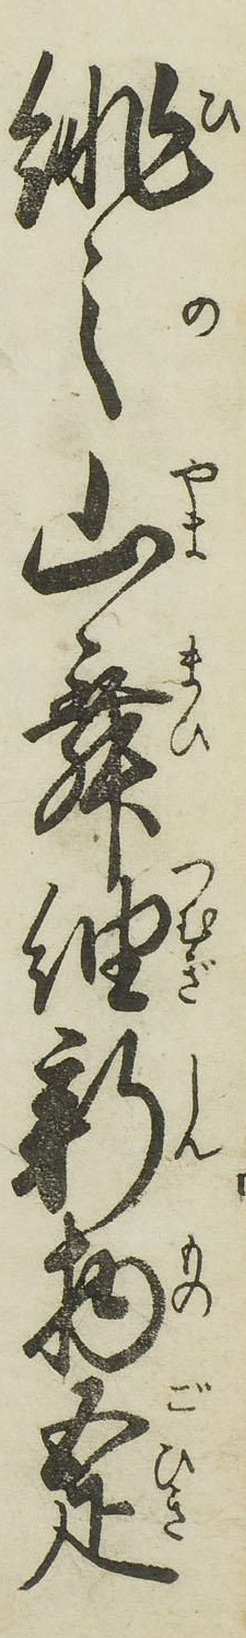緋之山舞紬新物五疋
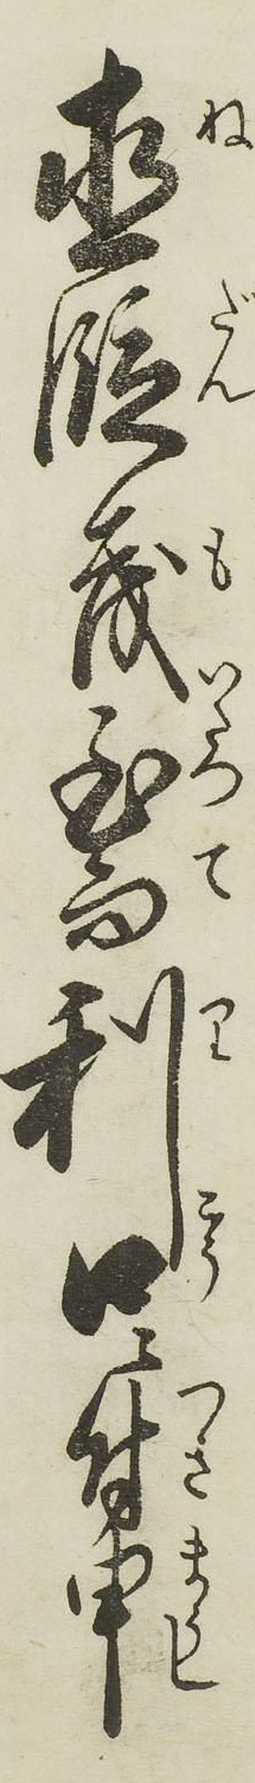直段茂至而利口付申
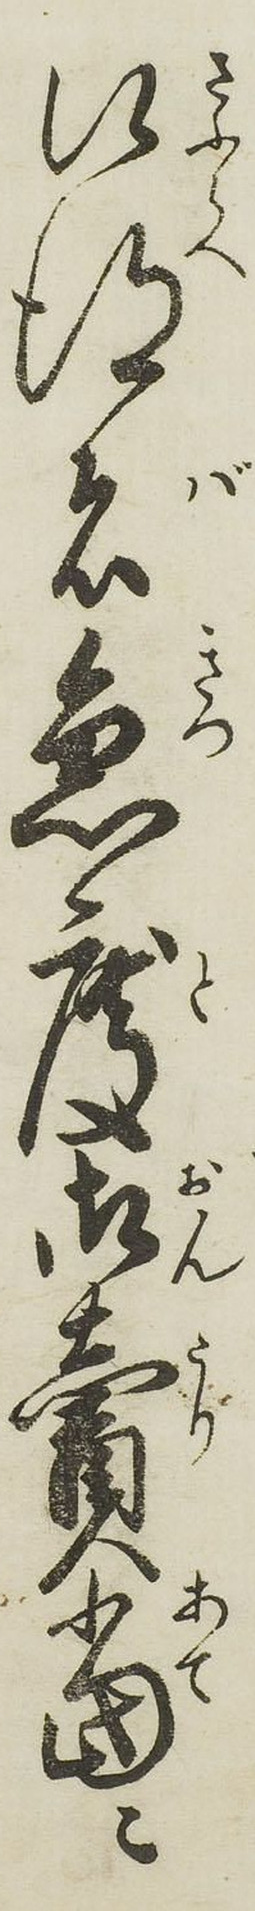候得者急度御売当
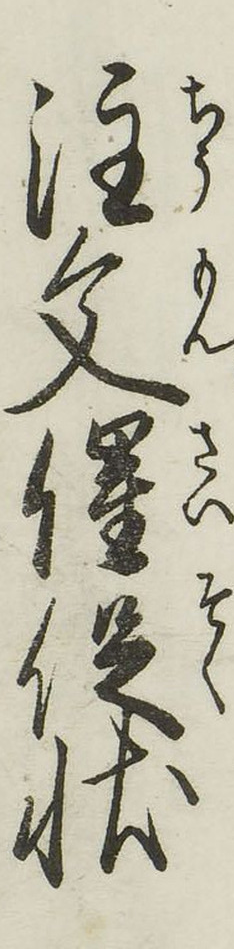注文催促状

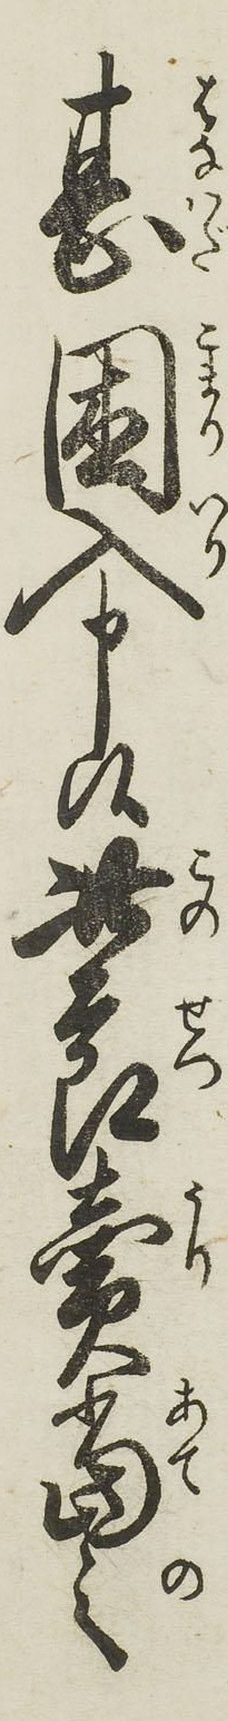甚困入申候此節売当之
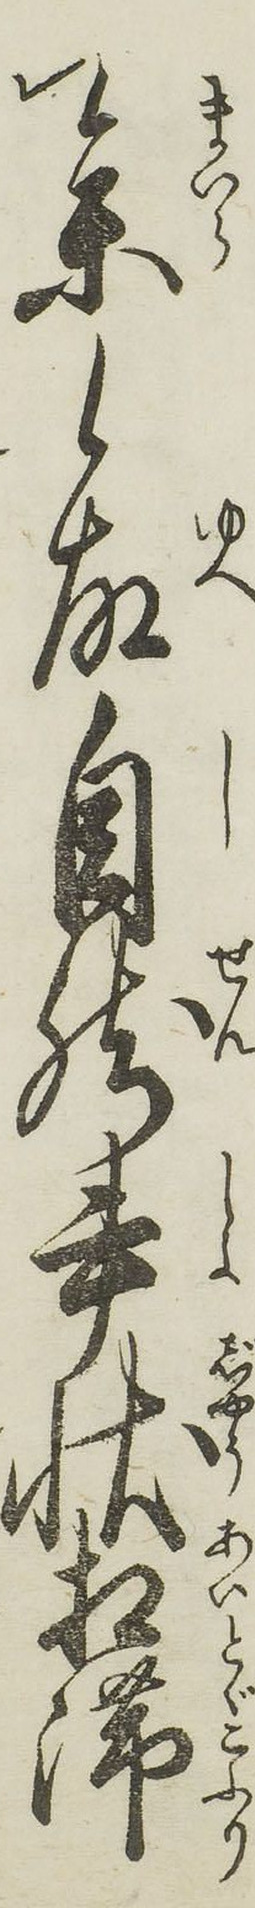参候故自然書状相滞
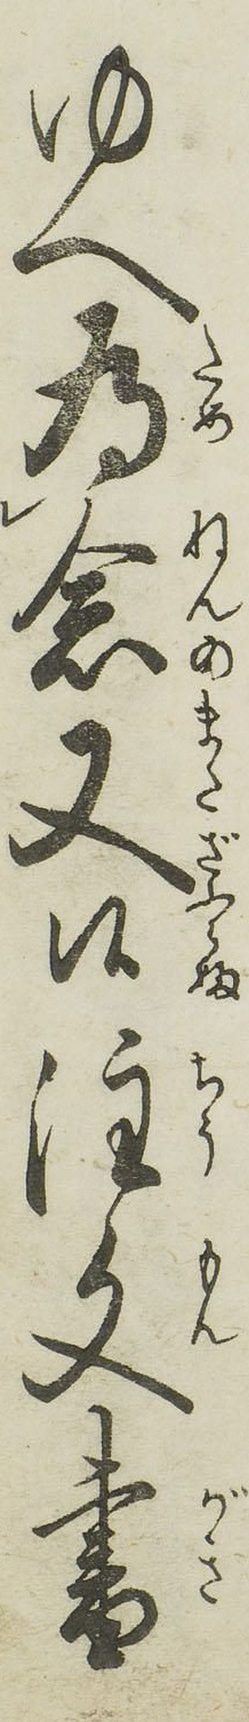ゆへ為念又候注文書

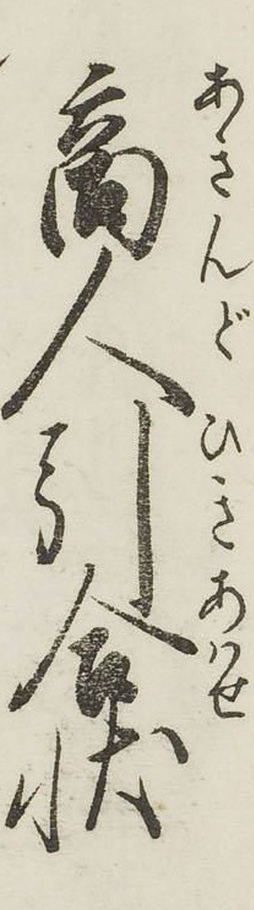商人引合状
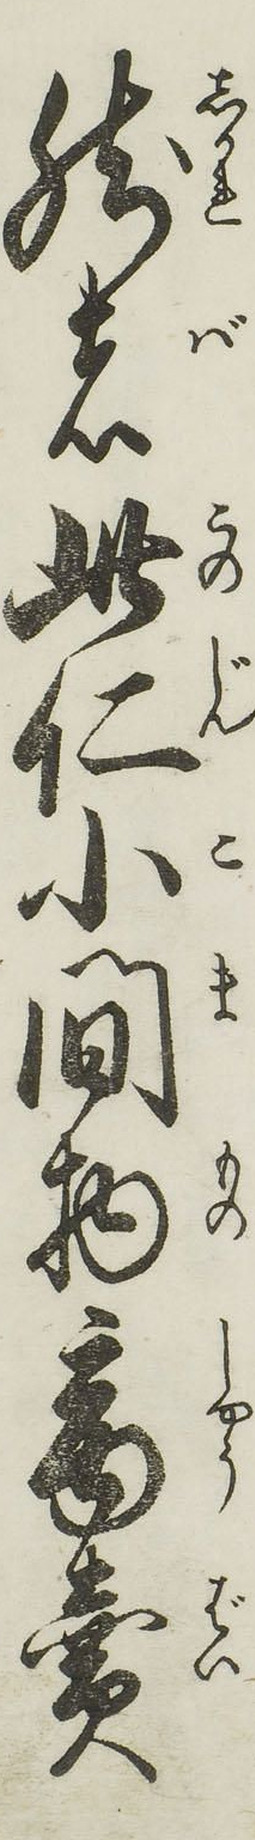然者此仁小間物商売

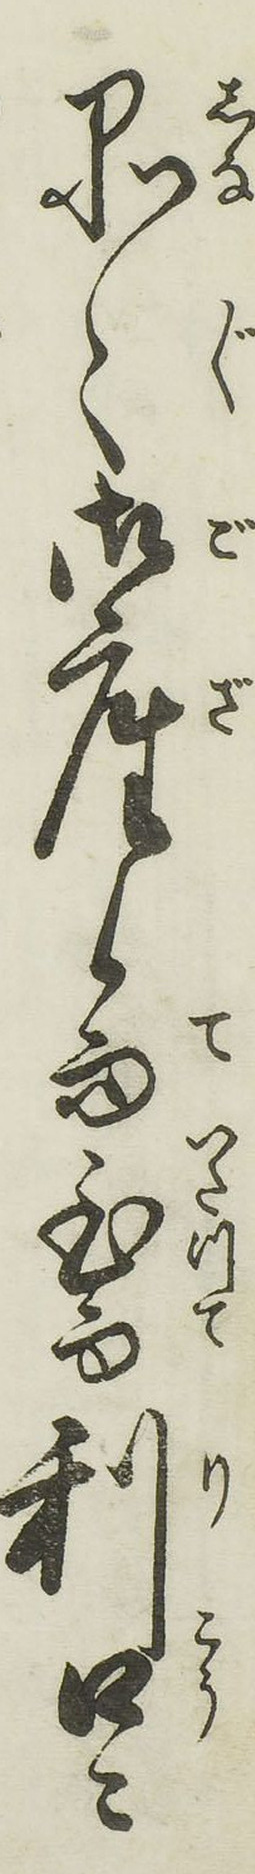品々御座候而至而利口に
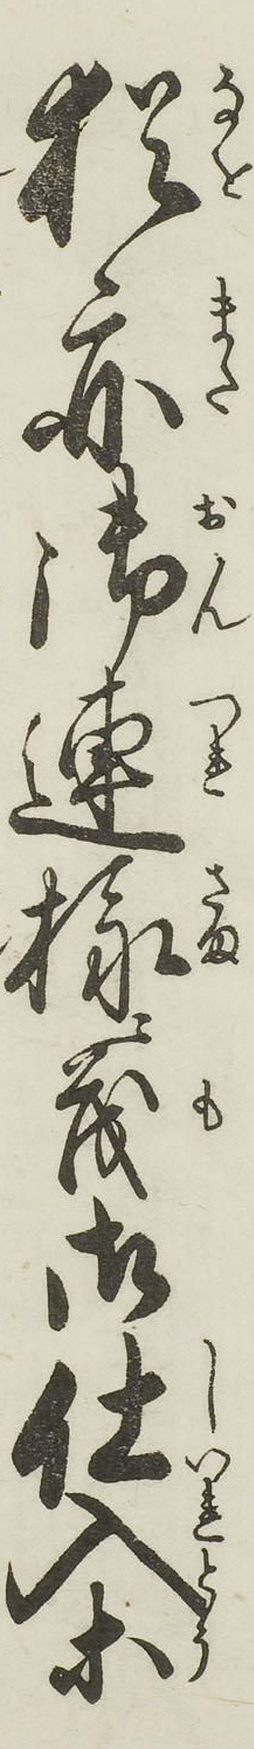猶亦御連様茂御仕入等
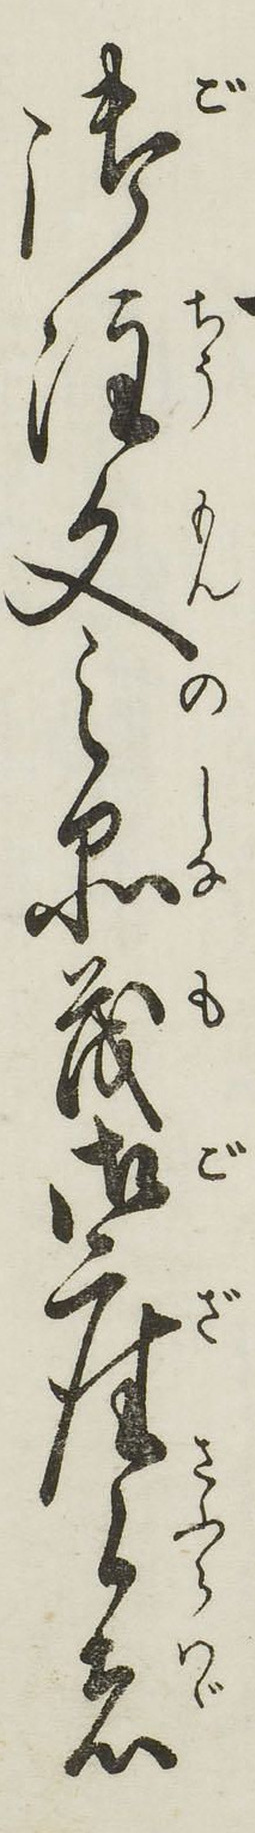御注文之品茂御座候者

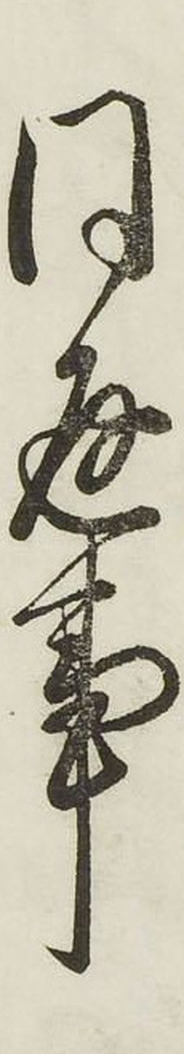同返事
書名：商人書翰便覧
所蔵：東京学芸大学教育コンテンツアーカイブ
